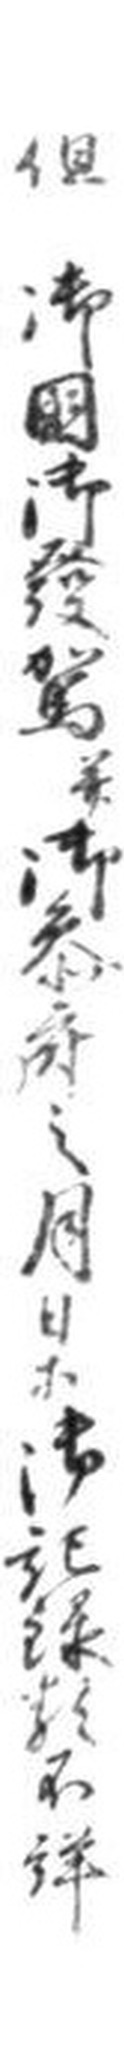但御国御発駕并御参府之月日等御記録類不詳
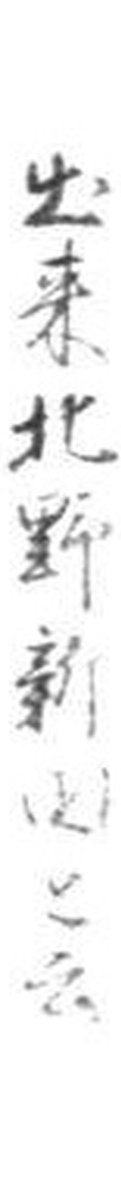出来北野新田と云
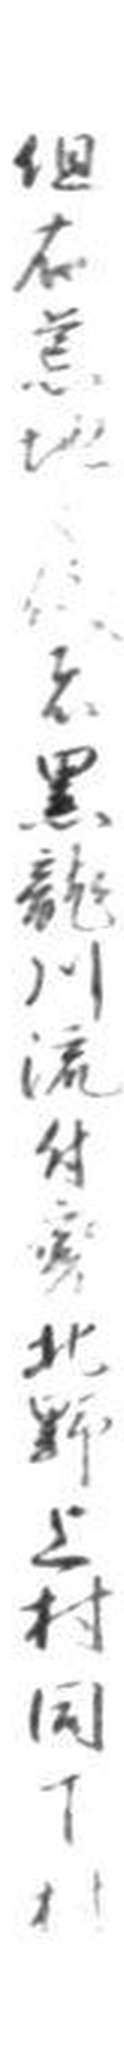但右荒地之儀は黒龍川流付変北野上村同下村
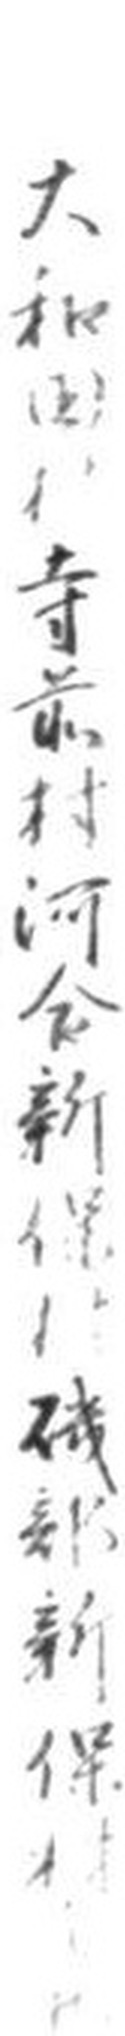大和田村寺前村河合新保村磯部新保村
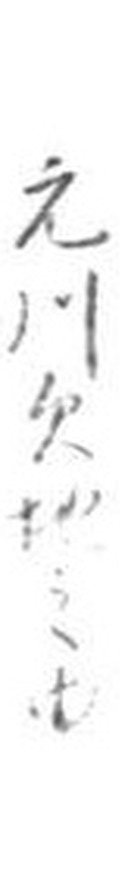元川欠地之由
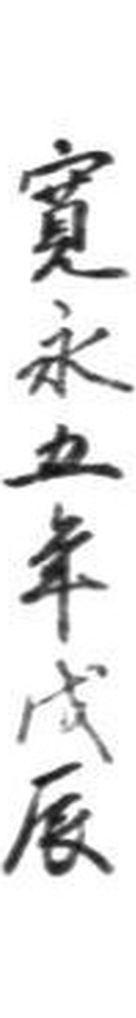寛永五年戊辰
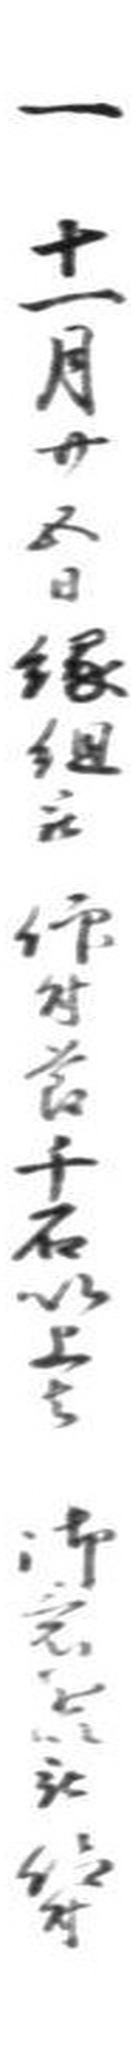一十一月廿五日縁組被仰付節千石以上は御意を以被仰付
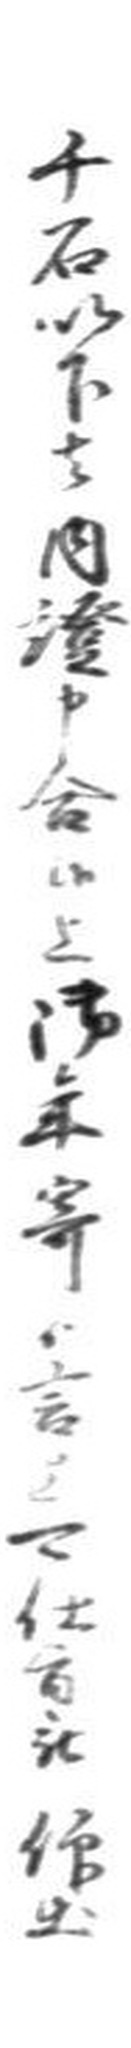千石以下は内証申合候上御年寄ゟ言上可仕旨被仰出
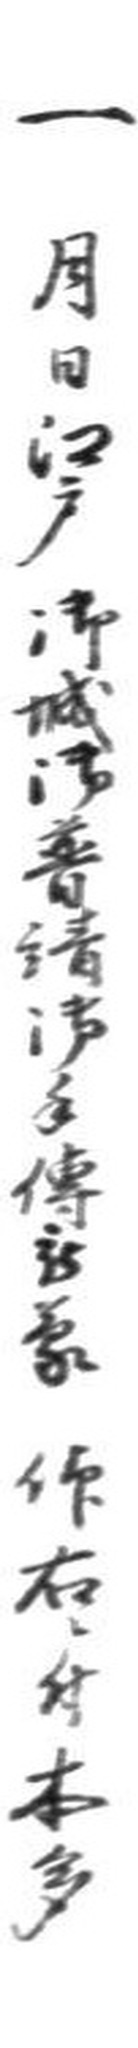一月日江戸御城御普請御手伝被蒙仰右ニ付本多
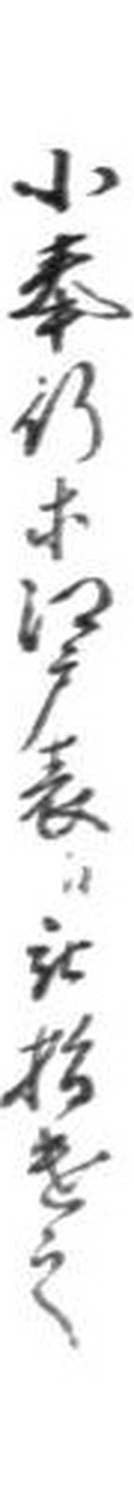小奉行等江戸表江被指遣之
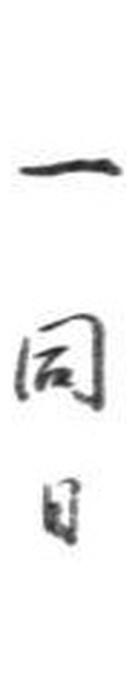一同日

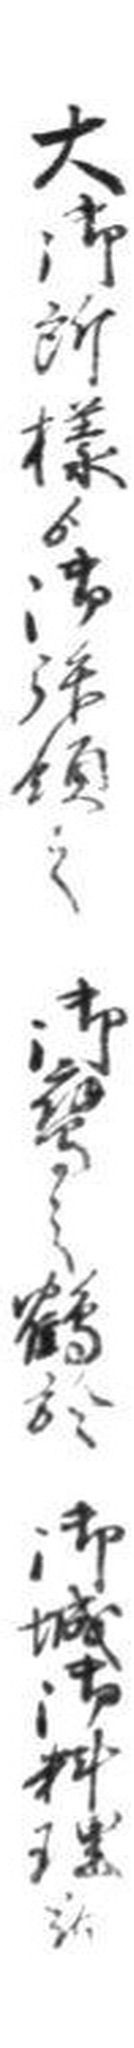大御所様ゟ御拝領之御鷹之鶴於御城御料理被
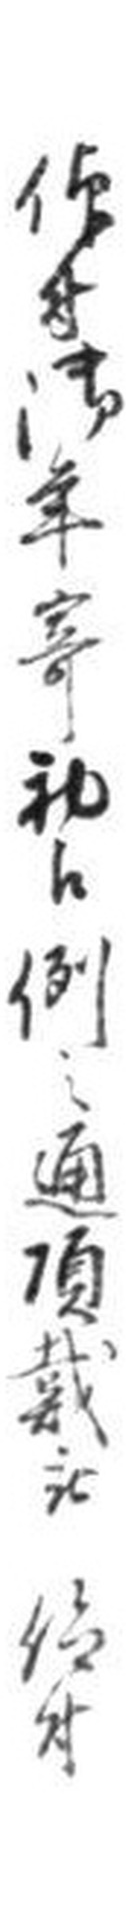仰付御年寄初江例之通頂戴被仰付
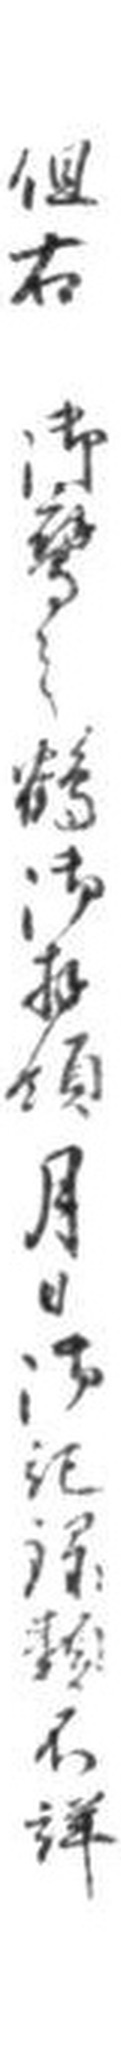但右御鷹之鶴御拝領月日御記録類不詳
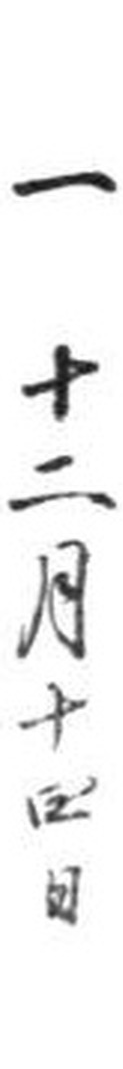一十二月十四日
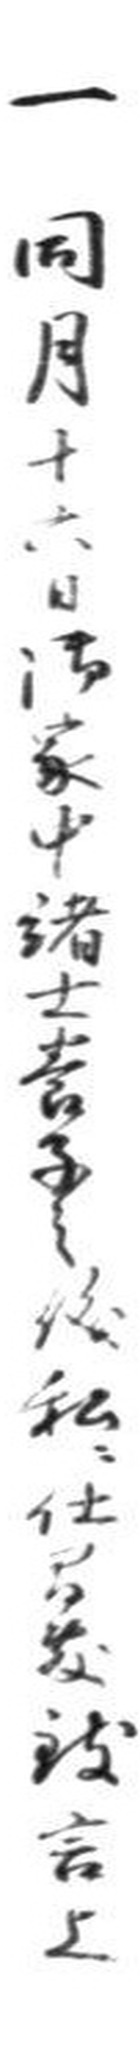一同月十六日御家中諸士養子之儀私ニ仕間敷致言上
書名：家譜 三 忠昌公 従慶長八年到寛永六年
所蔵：福井県文書館 Fukui Prefectural Archives
